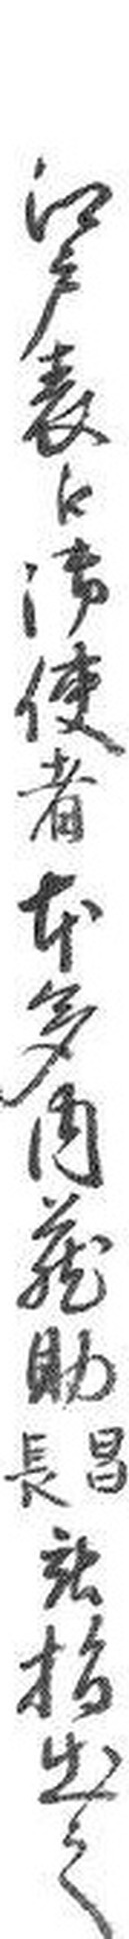江戸表江御使者本多内蔵助昌長被指出之
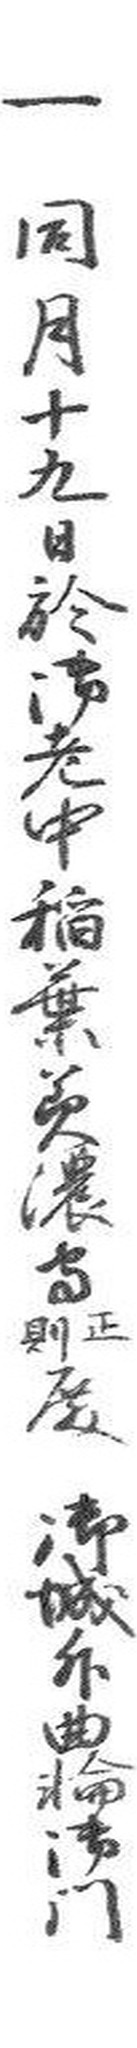一同月十九日於御老中稲葉美濃守正則殿御城外曲輪御門
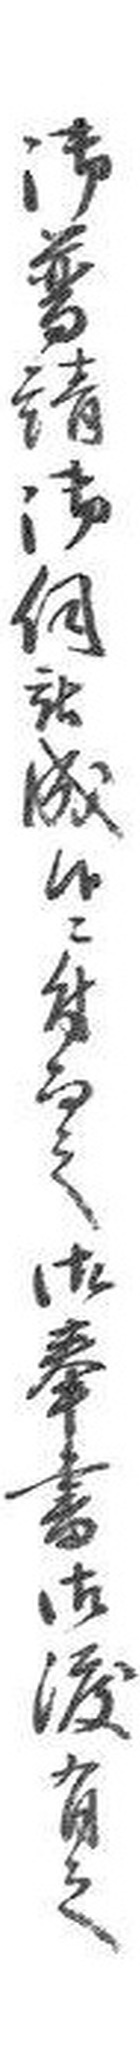御普請御伺被成候ニ付而之御奉書御渡有之
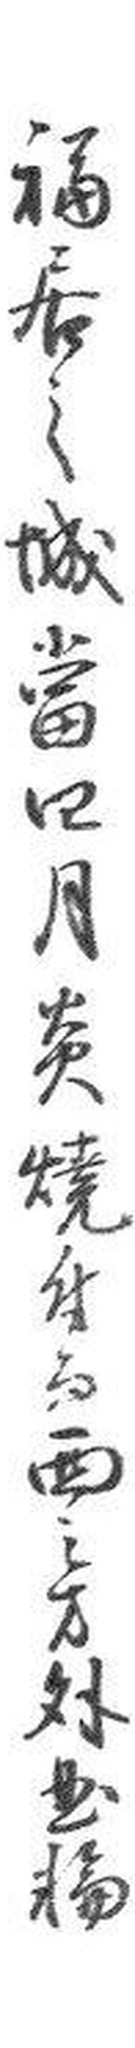福居之城当四月炎焼付而西之方外曲輪
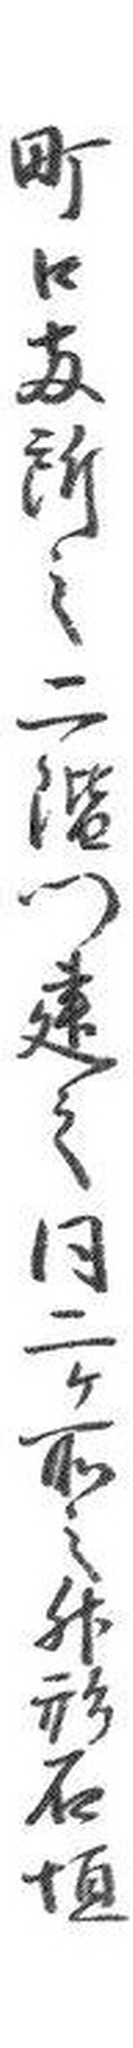町口両所之二階門建之同二ヶ所之升形石垣
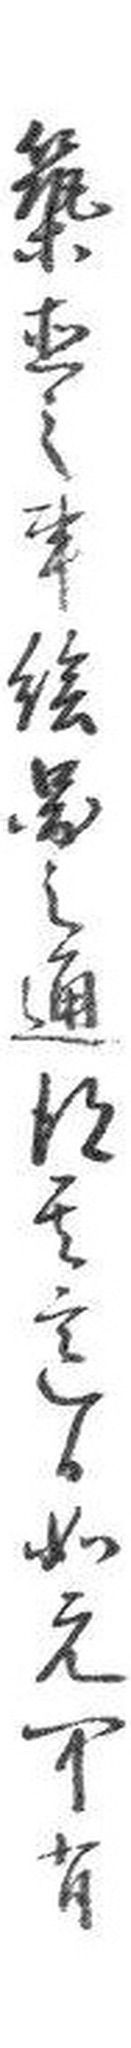築直之事絵図之通得其意候如元可有
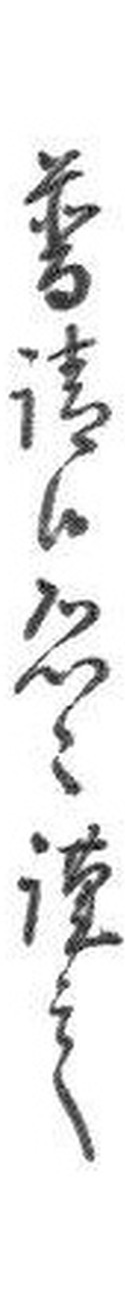普請候恐々謹言
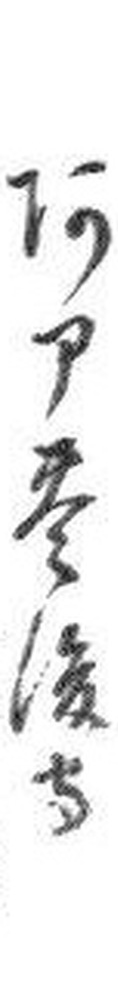阿部豊後守
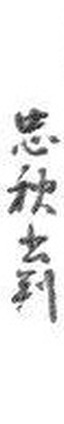忠秋書判
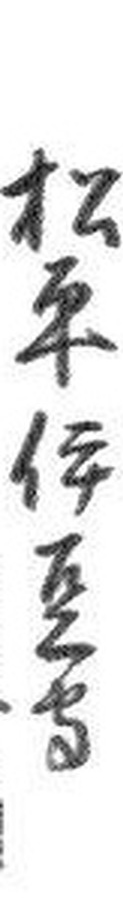松平伊豆守
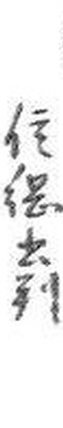信綱書判
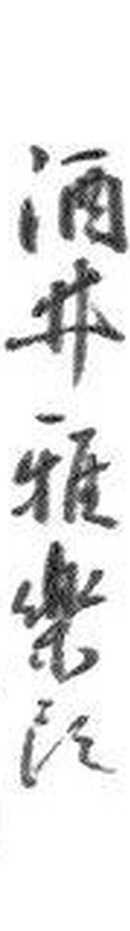酒井雅楽頭
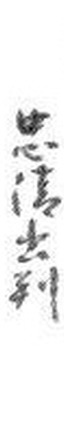忠清書判
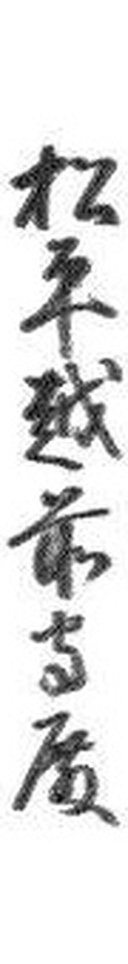松平越前守殿
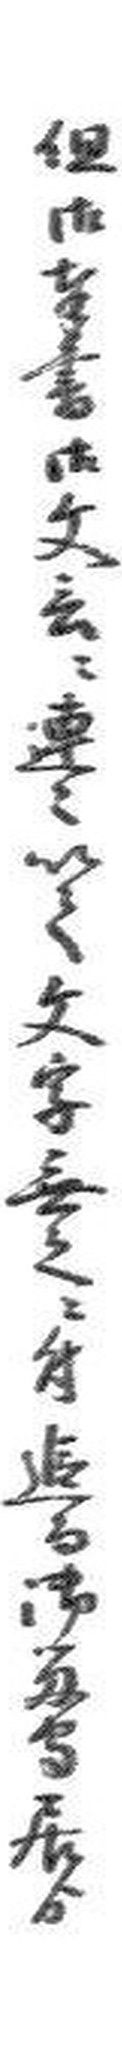但御奉書御文言ニ連々以之文字無之ニ付追而御留守居ゟ
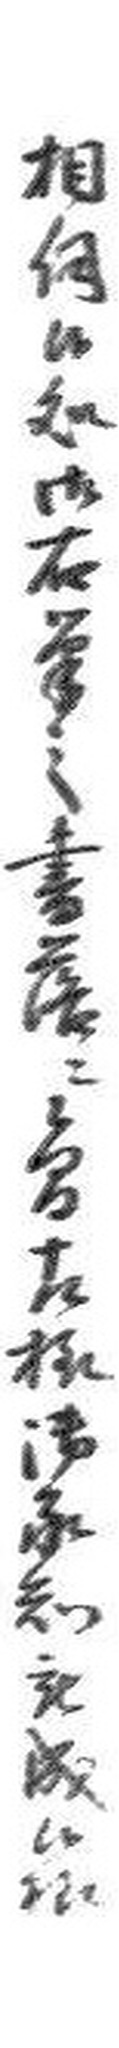相伺候処御右筆之書落ニ候間左様御承知被成候様
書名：家譜 五 光通公 従寛永十三年到万治二年
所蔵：福井県文書館 Fukui Prefectural Archives
